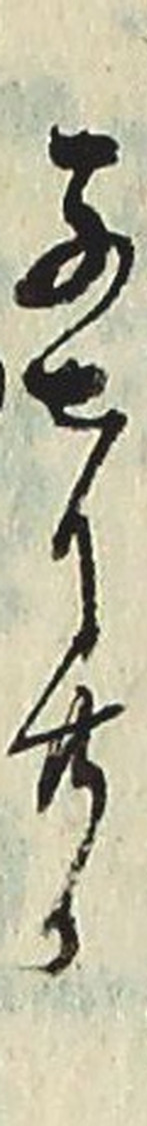子七月廿日
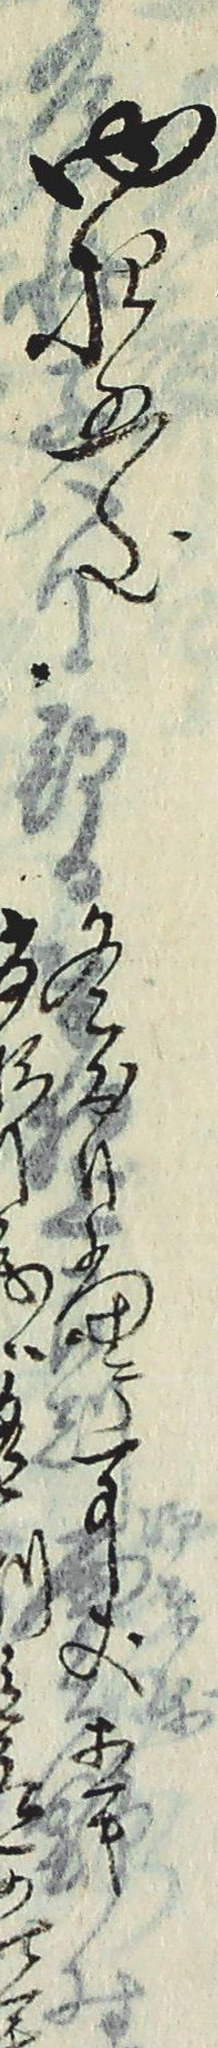内拾五匁冬分引当て可申使直き
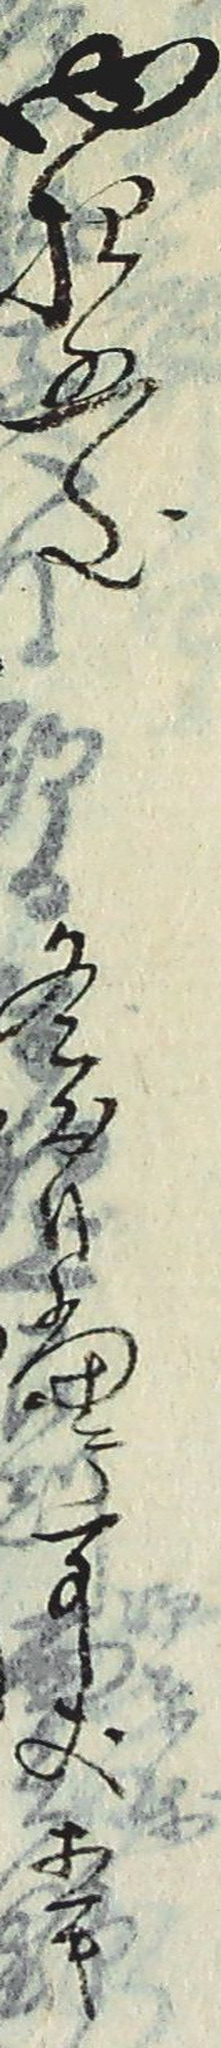内拾五匁冬分引当て可申使直き
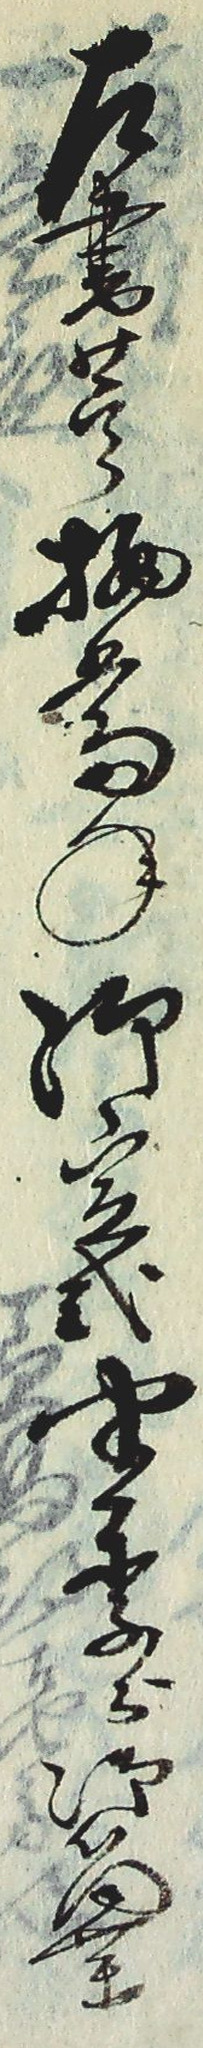左書苧柄当年御定式半季ゟ御筒薬
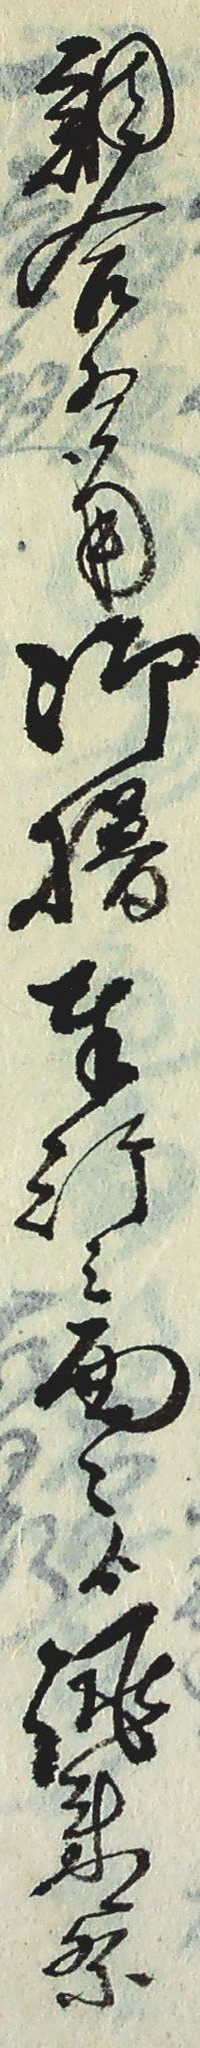調合為御用御櫓奉行之面々ゟ誂来候条
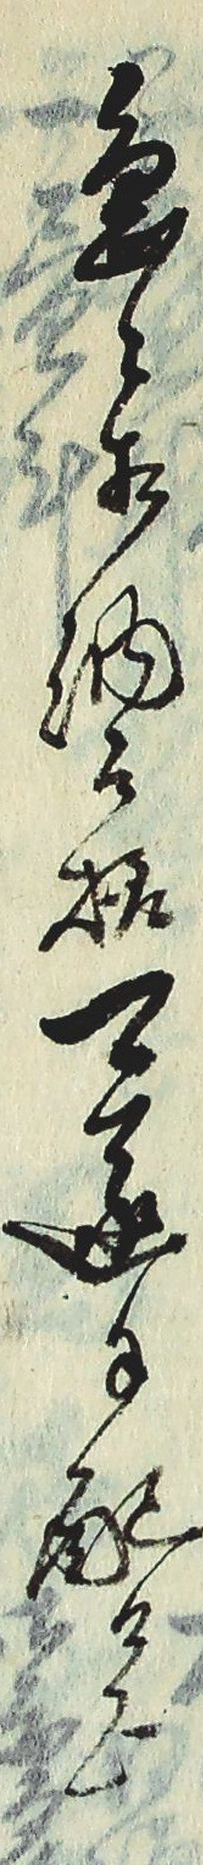急々相納候様可遂手配候以上
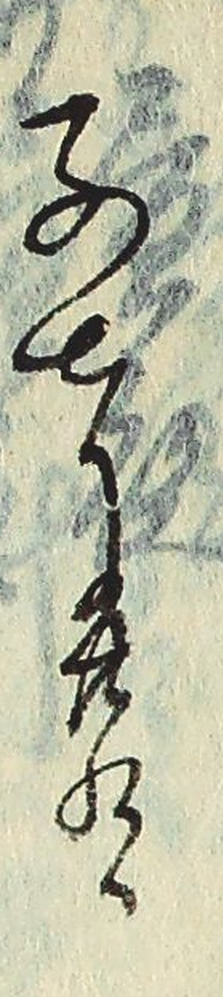子七月廿九日
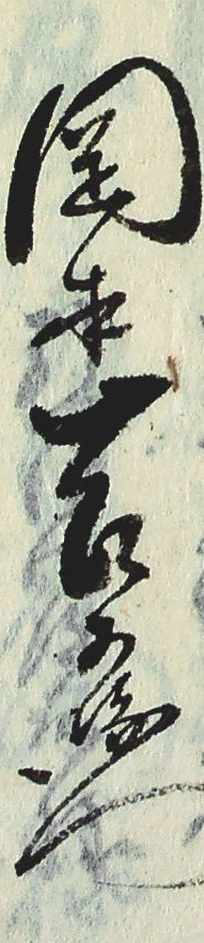岡本吉右衛門
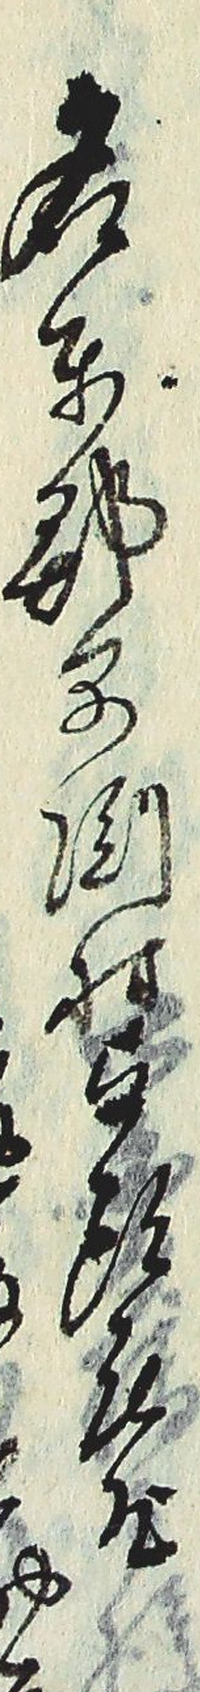名東郡早淵村与頭庄屋
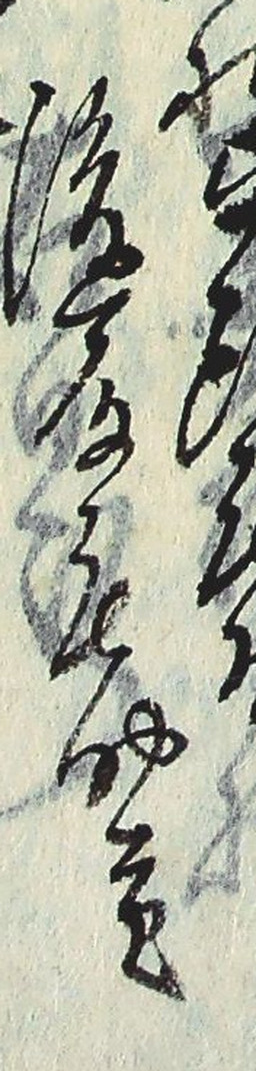後藤庄助方へ
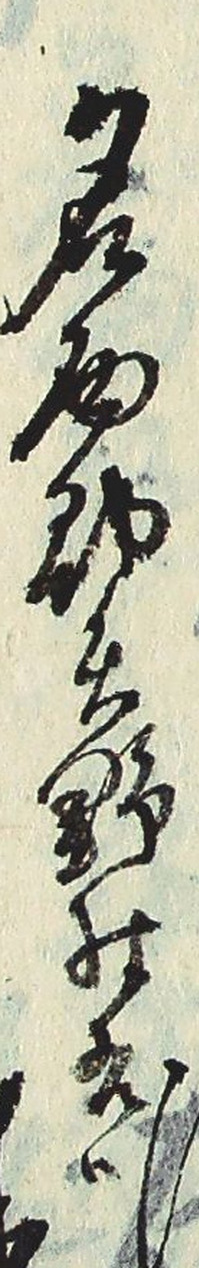名西郡矢野村右同
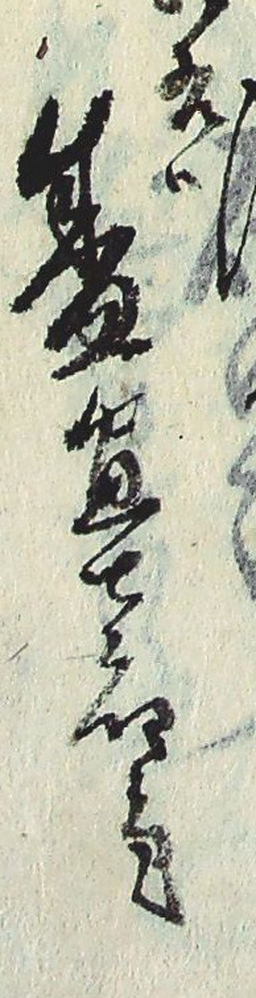盛宣七郎方へ

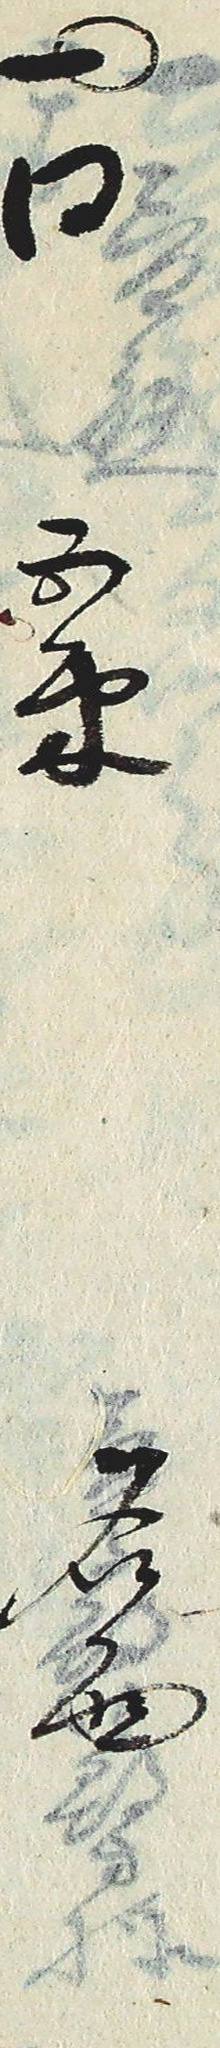一同五束名西
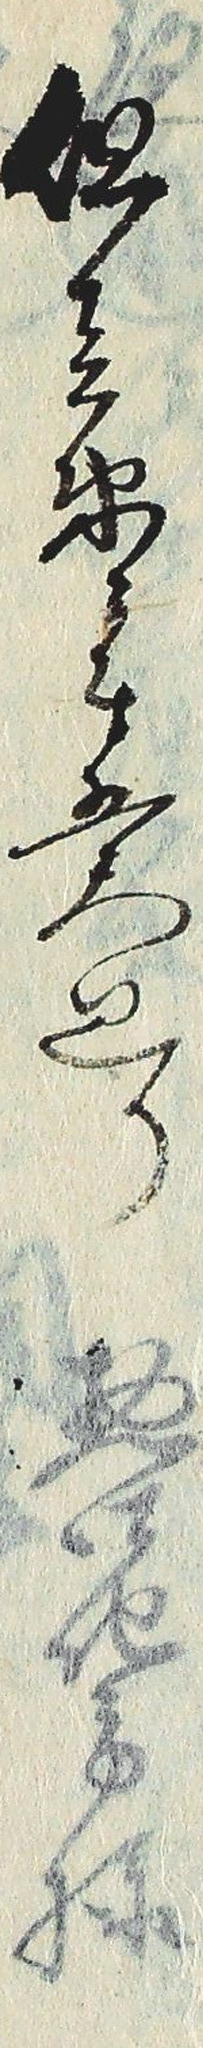但壱束に付五尺廻り
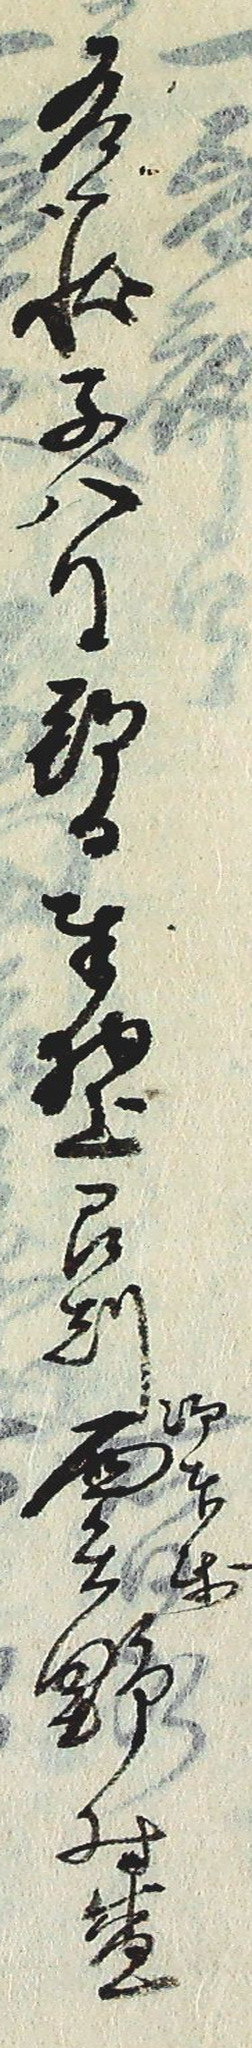右御状子八月朔日奉拝上即刻御本紙西矢野村盛
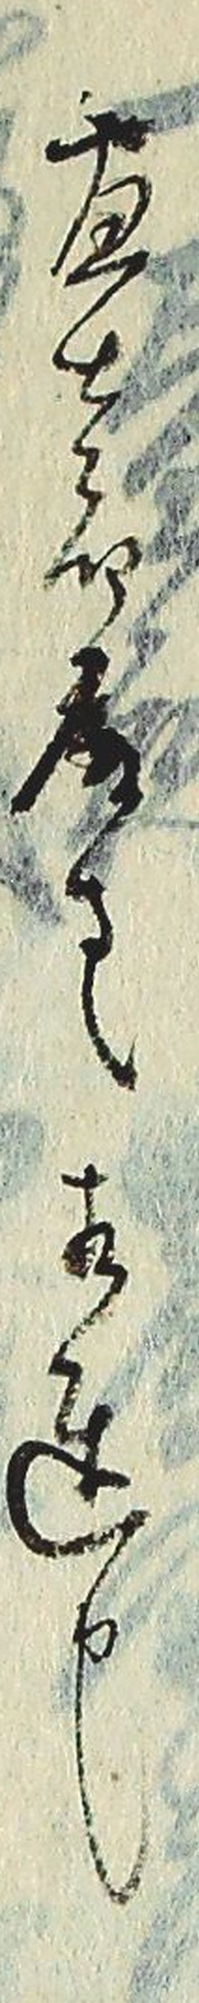宣七郎殿方へ相達申候
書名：名東郡中諸割賦元帳
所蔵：鳴門教育大学 Naruto University of Education
